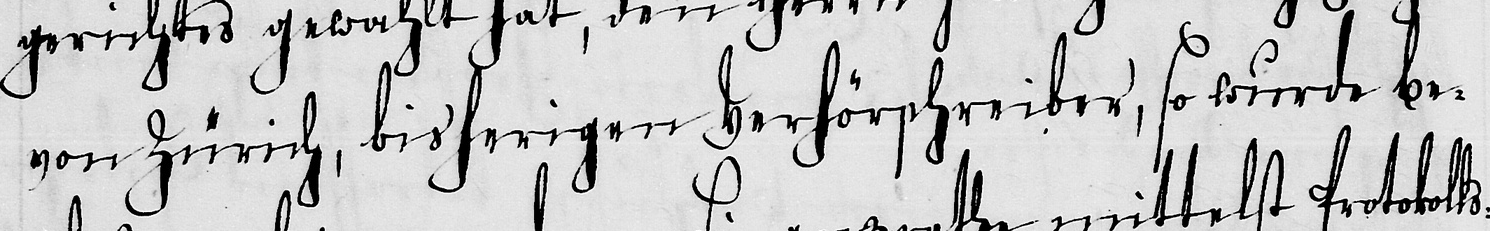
von Zürich, bisherigen Verhörschreiber, so wurde be¬
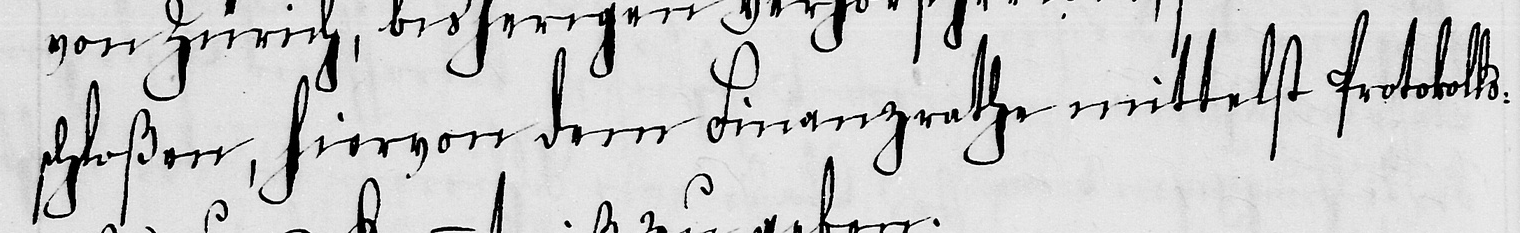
schloßen, hiervon dem Finanzrathe mittelst Protokol¬
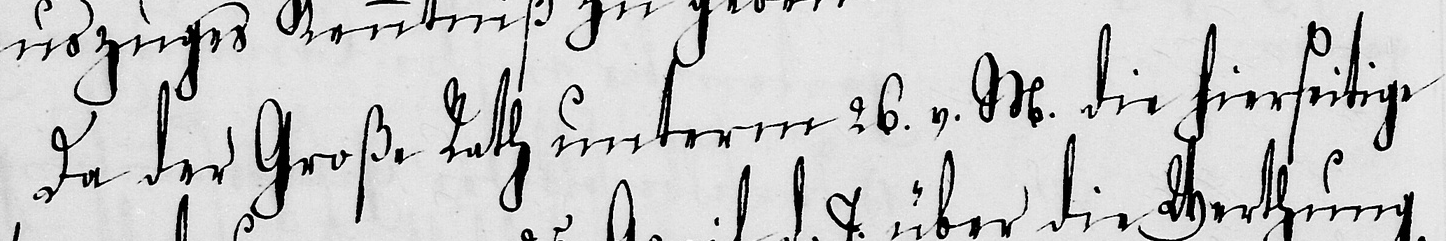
Da der Große Rath unterm 26. v. M. die hierseitige
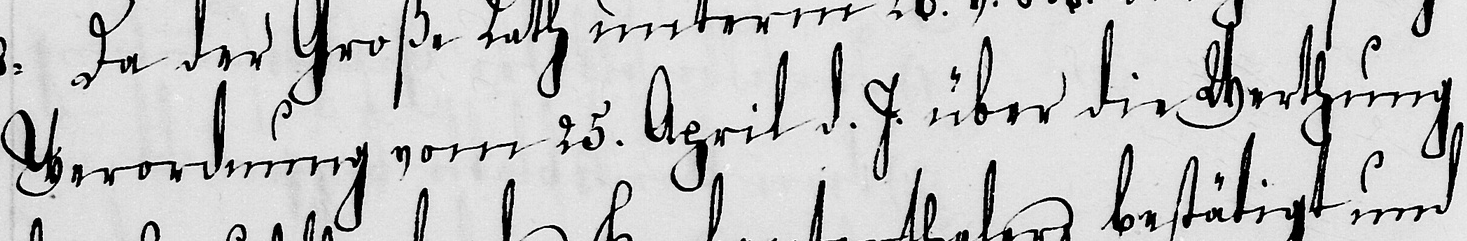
Verordnung vom 25. April d. J. über die Werthung
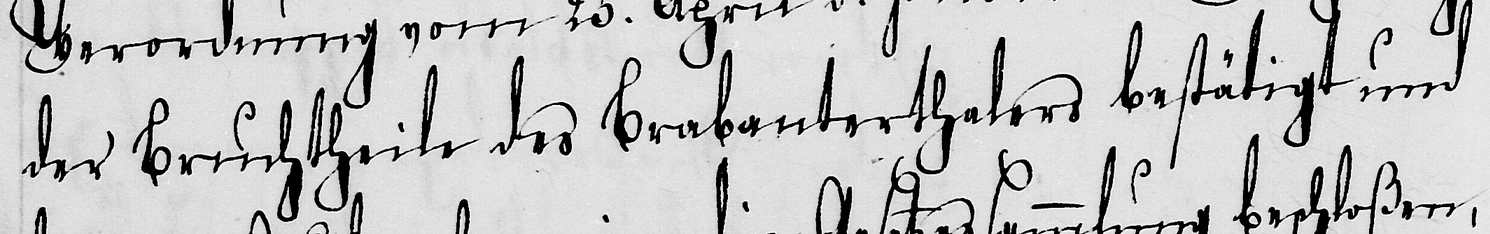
der Bruchtheile des Brabanterthalers bestätigt und
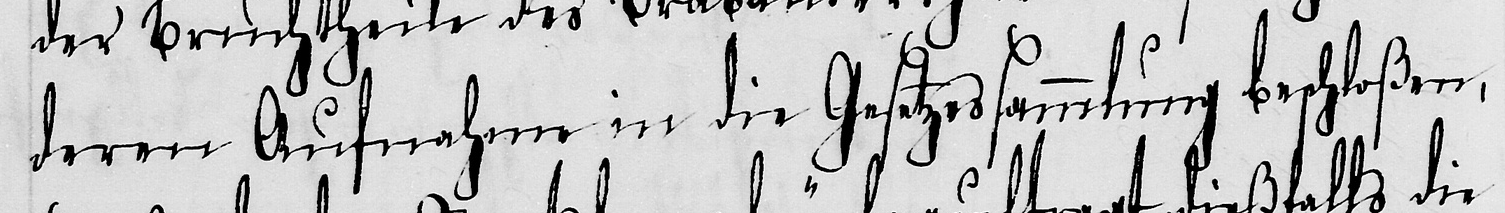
deren Aufnahme in die Gesetzessammlung beschloßen,
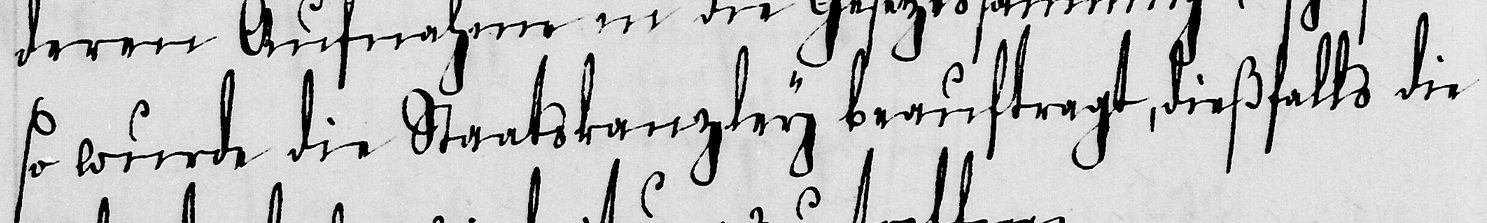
so wurde die Staatskanzley beauftragt, dießfalls die
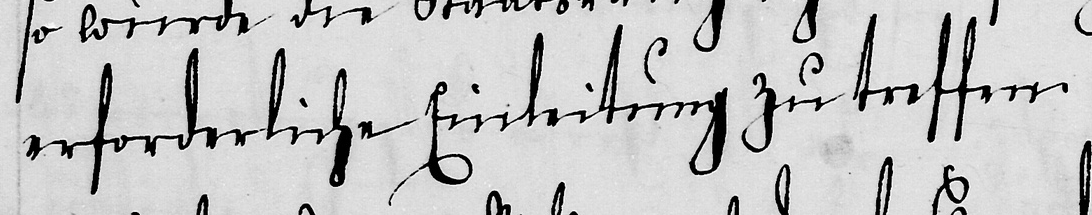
erforderliche Einleitung zu treffen.
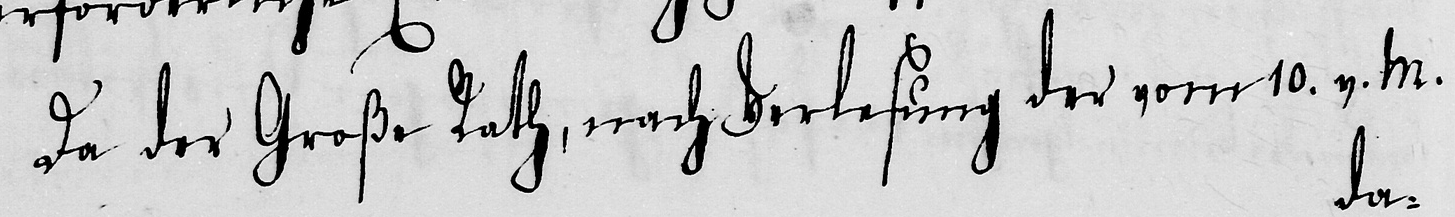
Da der Große Rath, nach Verlesung der vom 10. v. M.
